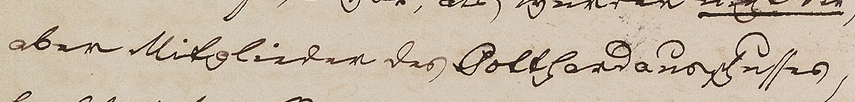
aber Mitglieder des Gotthardausschusses,
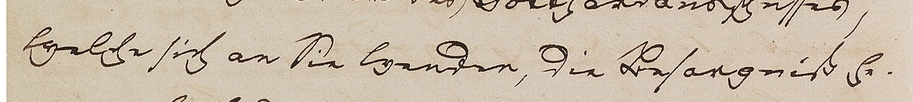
welche sich an Sie wenden, die Besorgniß he-
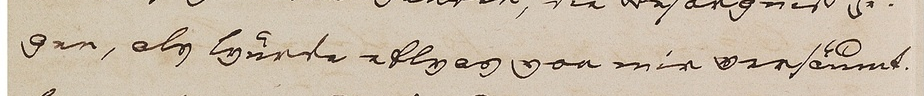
gen, als würde etwas von mir versäumt.
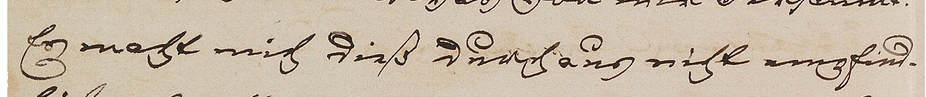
Es macht mich dieß durchaus nicht empfind-
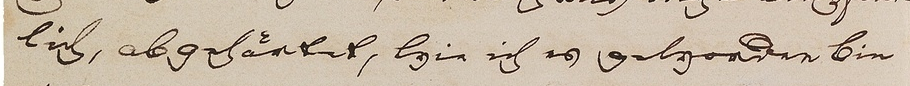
lich, abgehärtet, wie ich es geworden bin
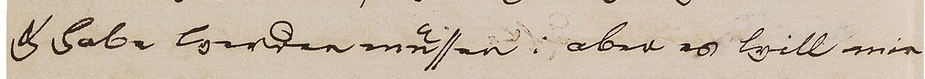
& habe werden müssen: aber es will mir
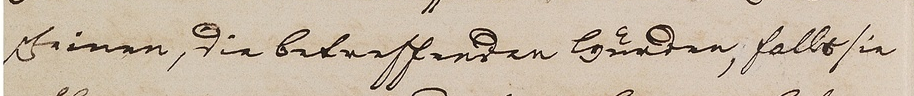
scheinen, die Betreffenden würden, falls sie
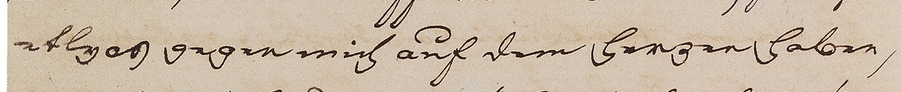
etwas gegen mich auf dem Herzen haben,
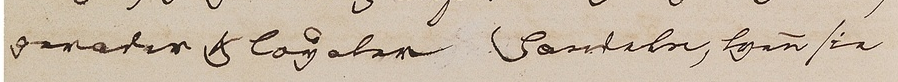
gerader & loyaler handeln, wenn sie
